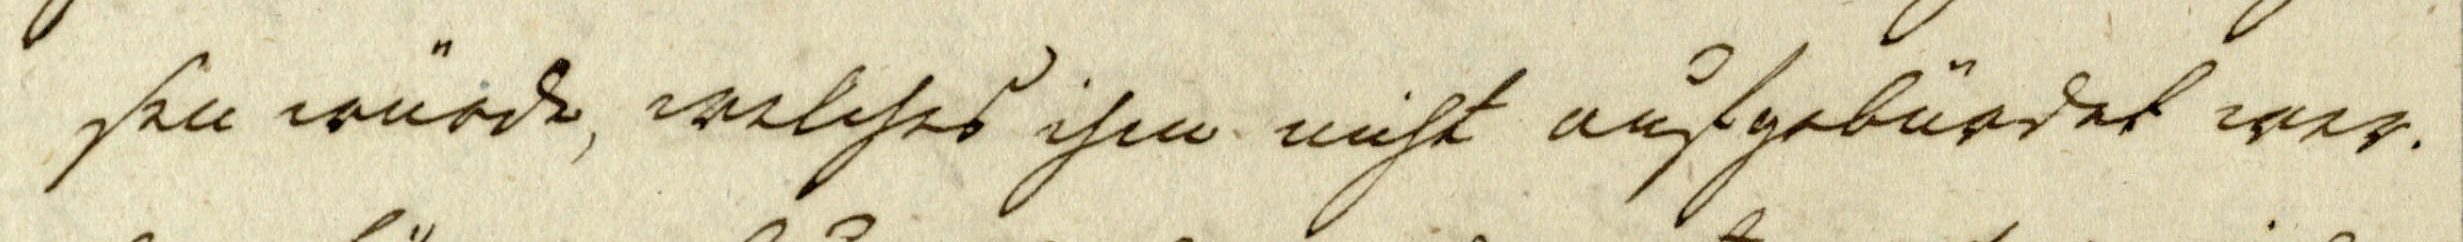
sen würde, welches ihm nicht aufgebürdet wer¬
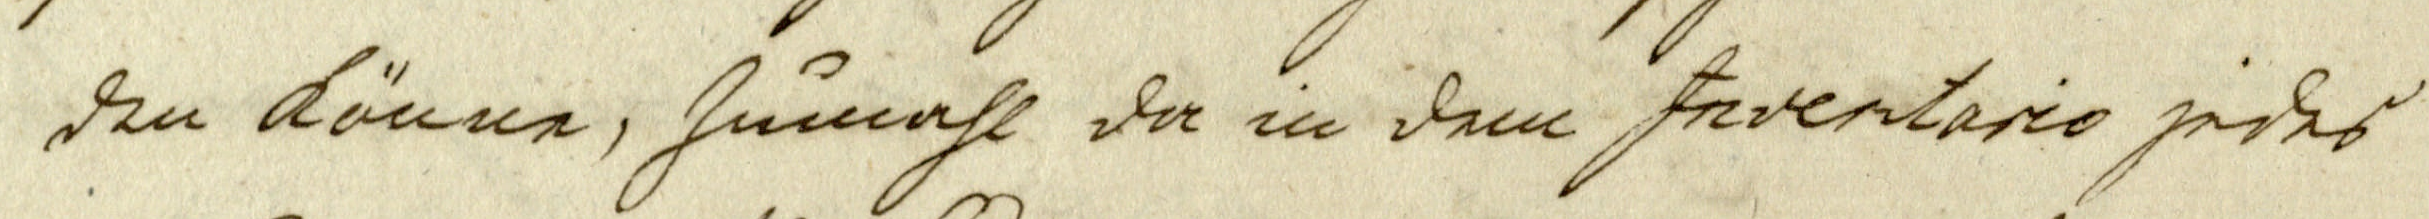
den könne, zumahl da in dem Inventario jedes
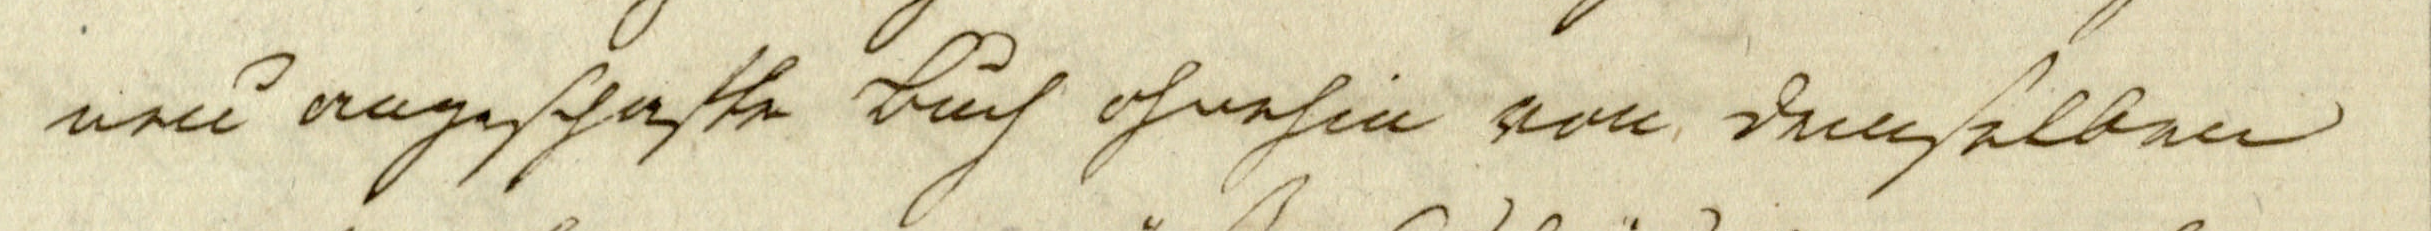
neu angeschafte Buch ohnehin von demselben
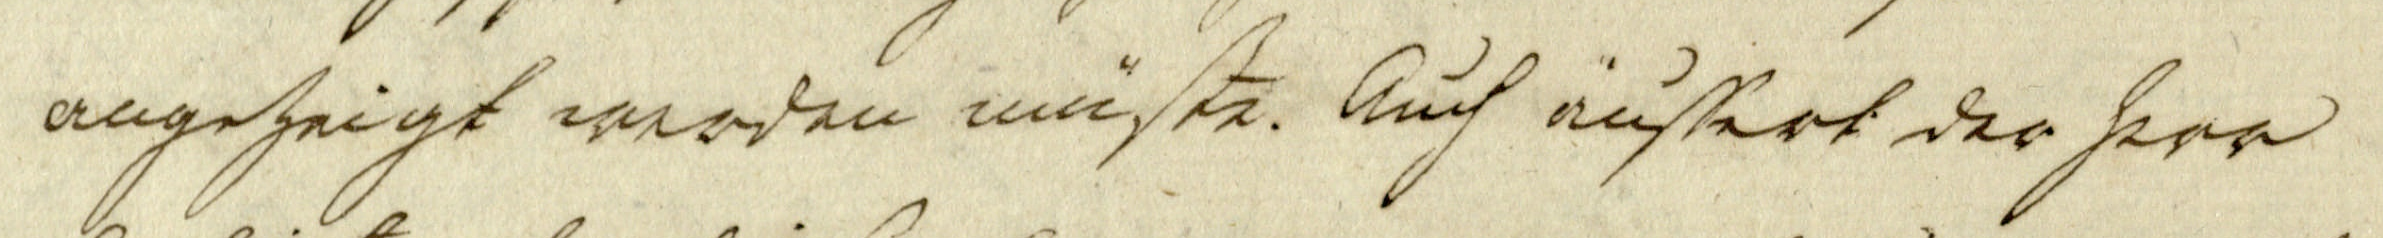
angezeigt werden müste. Auch äussert der herr
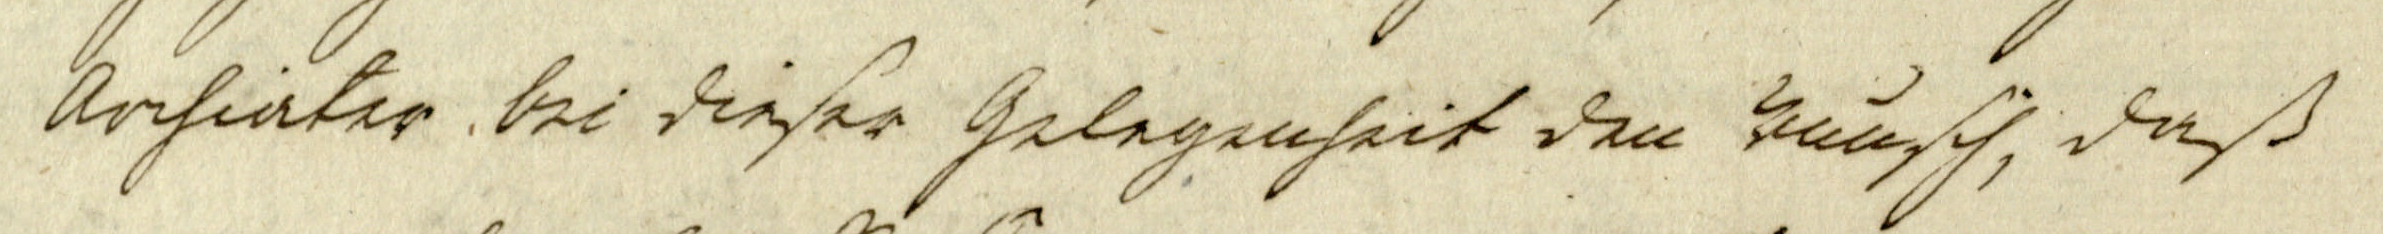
Archiater bei dieser Gelegenheit den Wunsch, daß
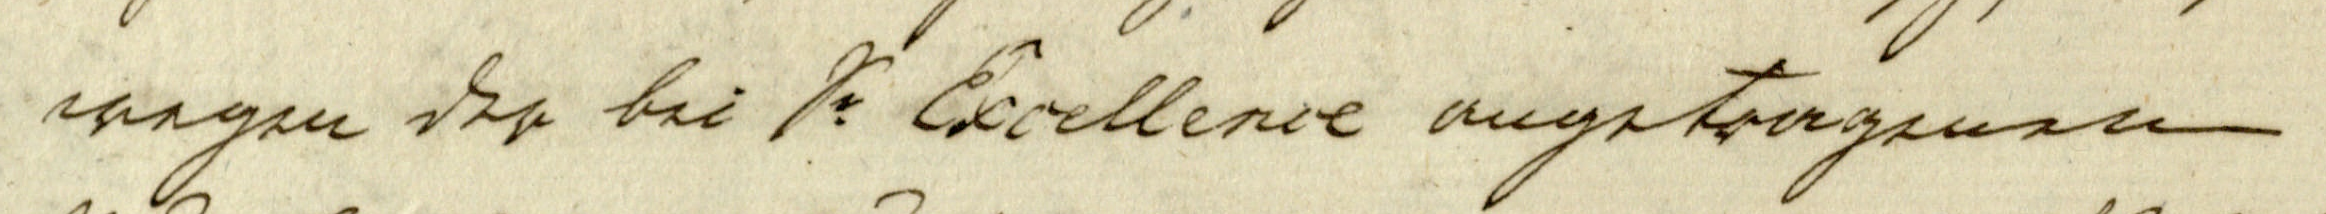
wegen der bei Sr. Excellence angetragenen
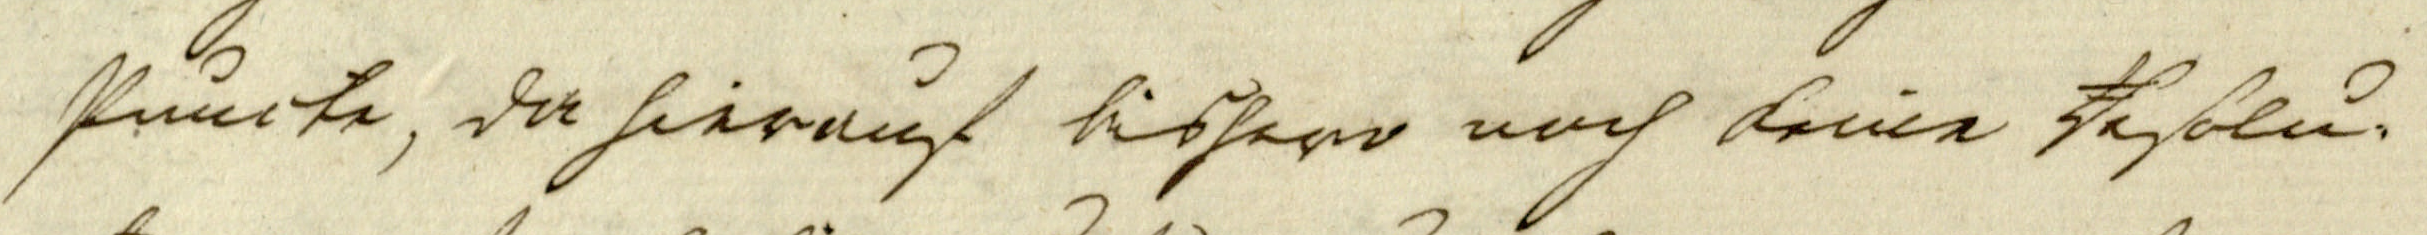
Puncte, da hierauf bishero noch keine Resolu¬
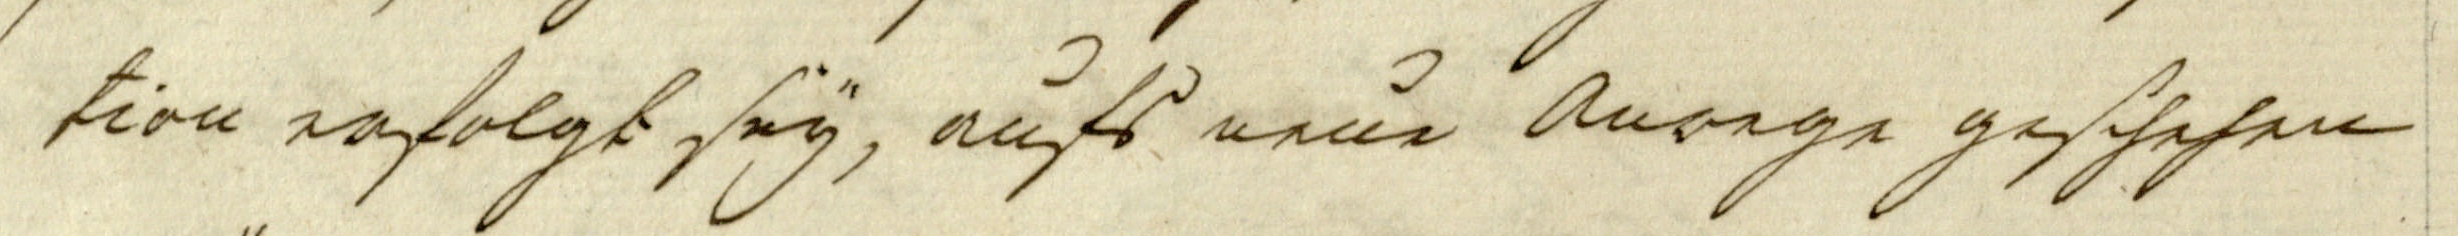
tion erfolgt seÿ, aufs neue Anrege geschehen
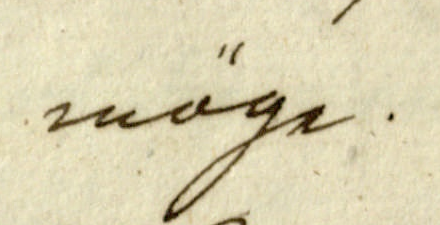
möge.
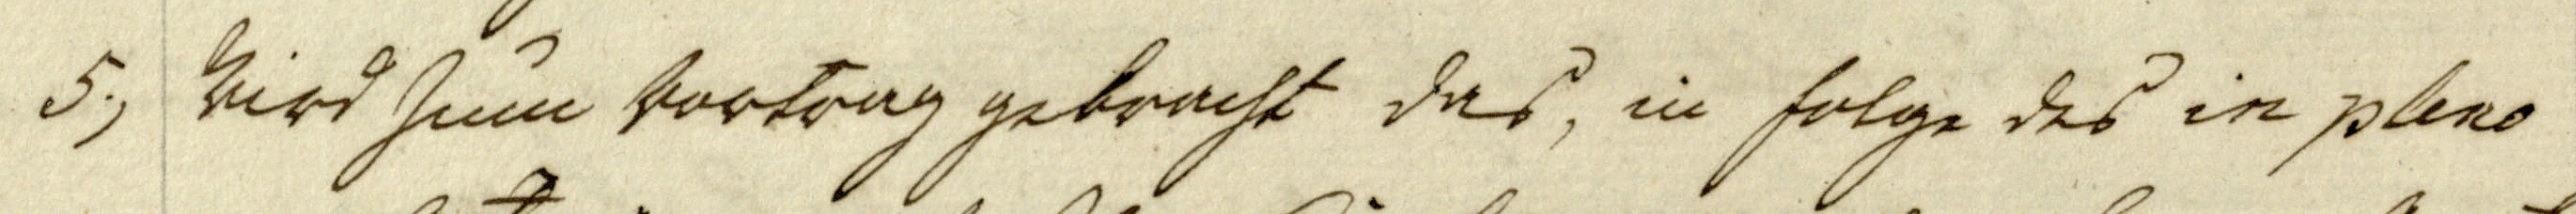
5., Wird zum Vortrag gebracht das, in Folge des in pleno
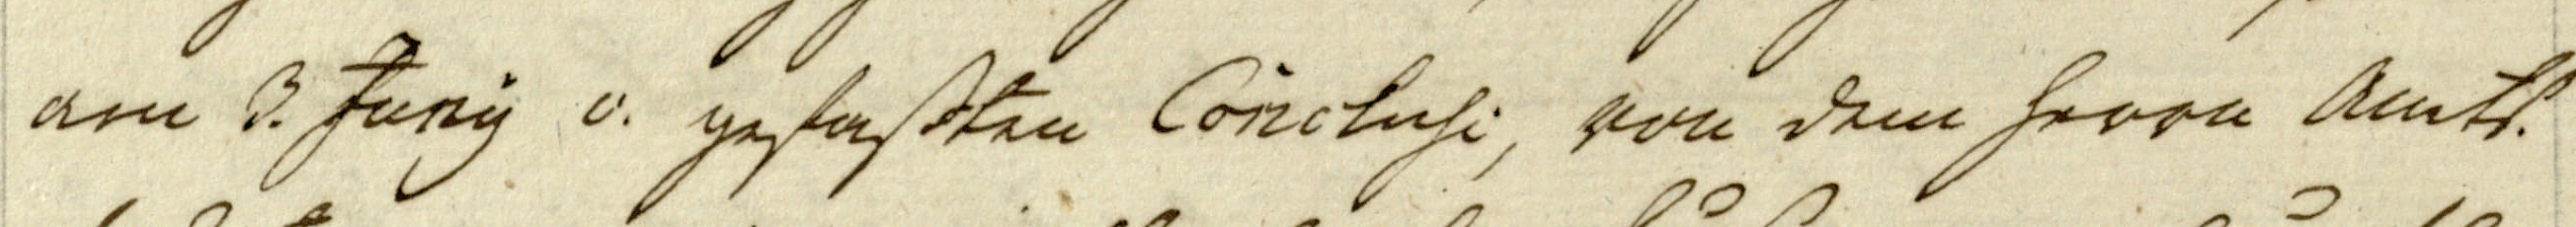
am 3. Junÿ a. gefaßten Conclusi, von dem herrn Amts¬
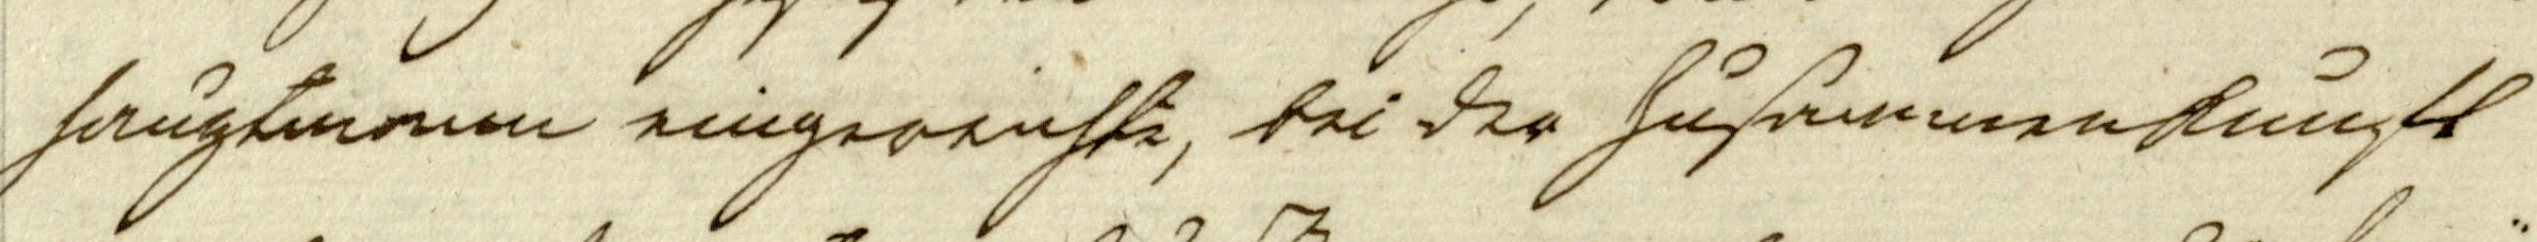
hauptmann eingereichte, bei der Zusammenkunft
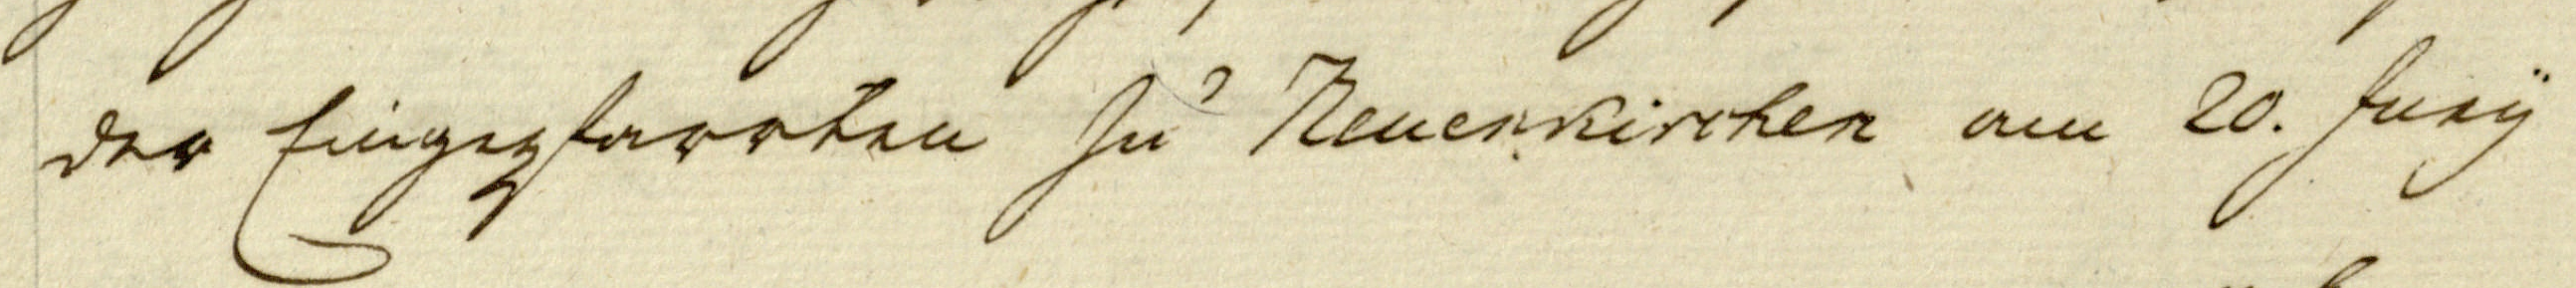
der Eingepfarrten zu Neuenkirchen am 20. Junÿ
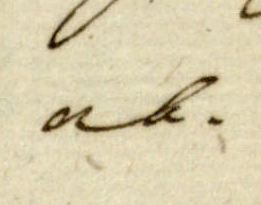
ab.
